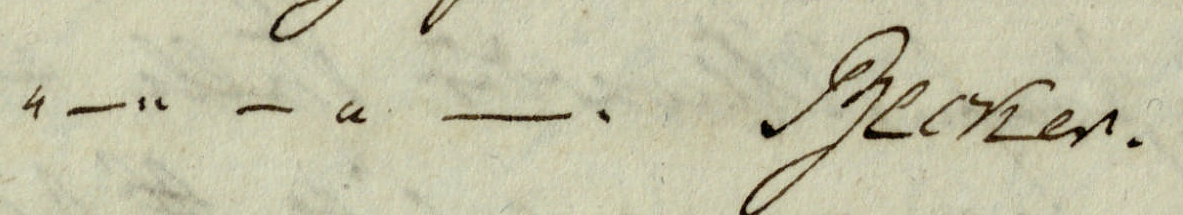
" — " — " — . Becker.
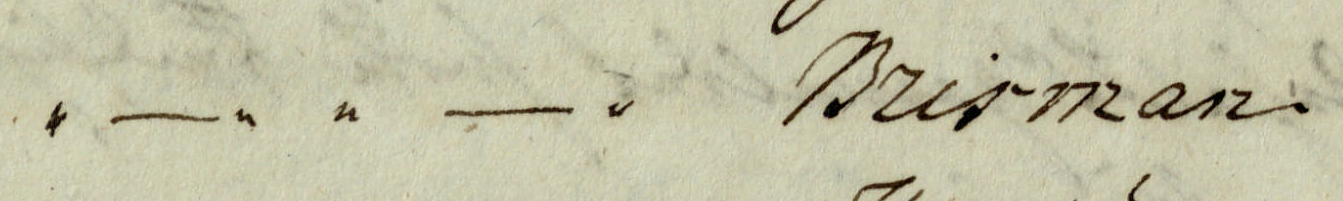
" — " " — " Brisman.
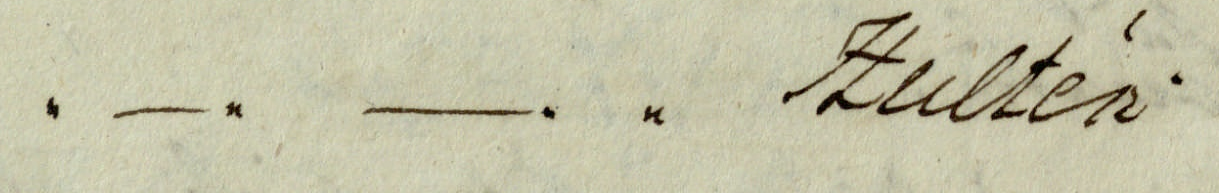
" — " — . " Hultén.
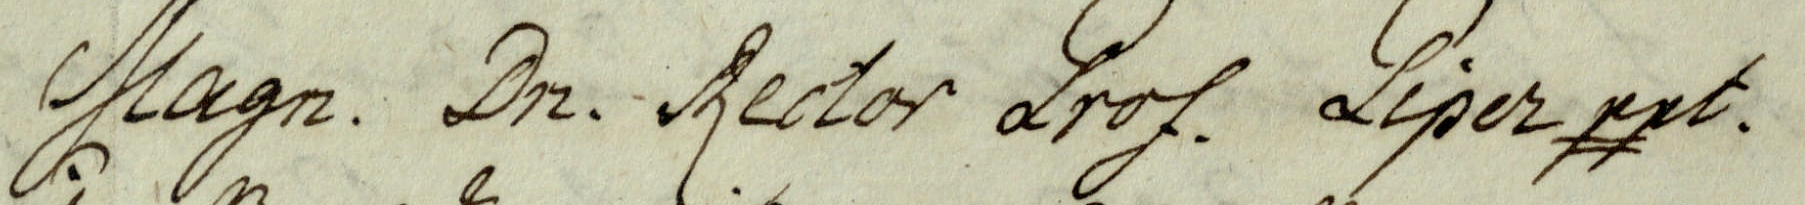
Magn. Dn. Rector Prof. Piper ppt.
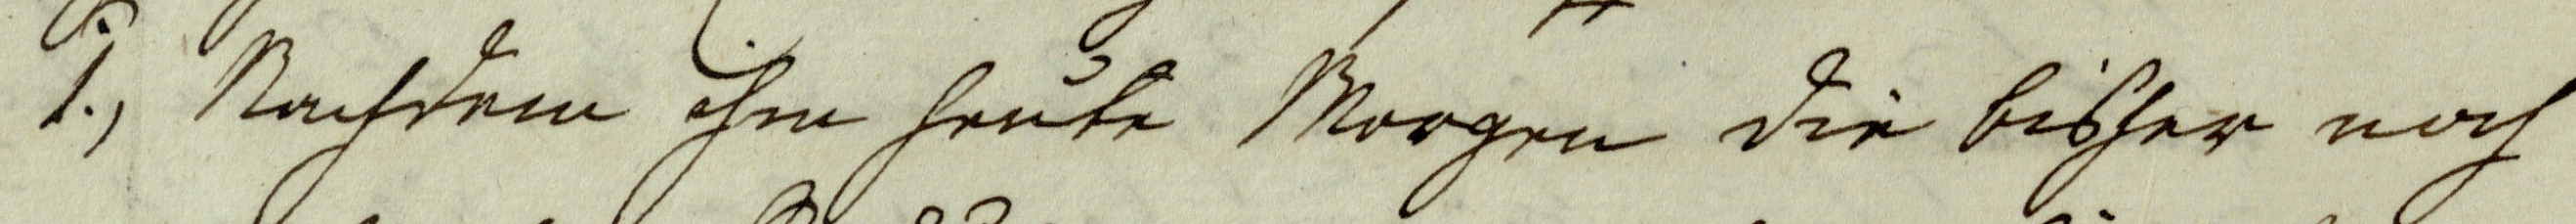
1., Nachdem ihm heute Morgen die bisher noch
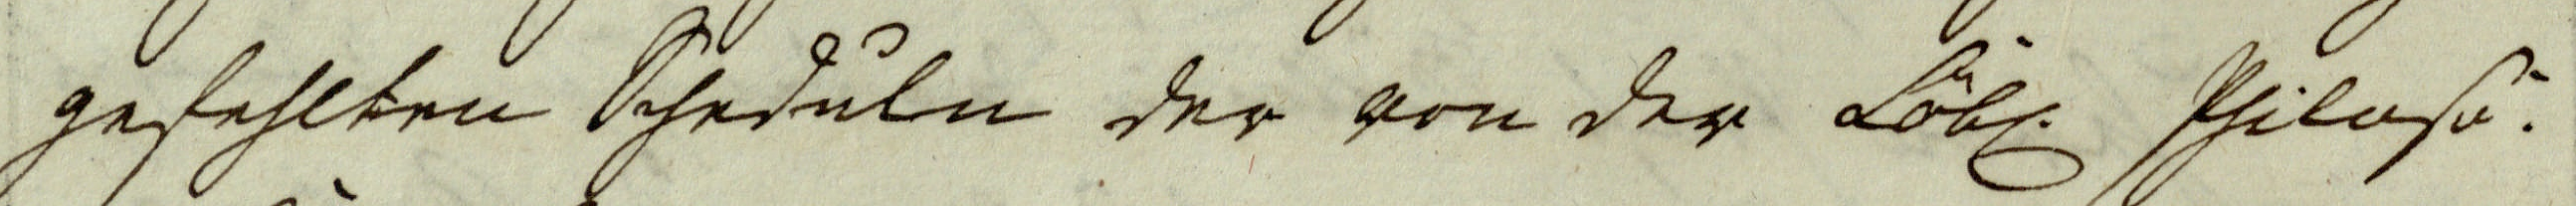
gefehlten Schedulen der von der Löbl. Philoso¬
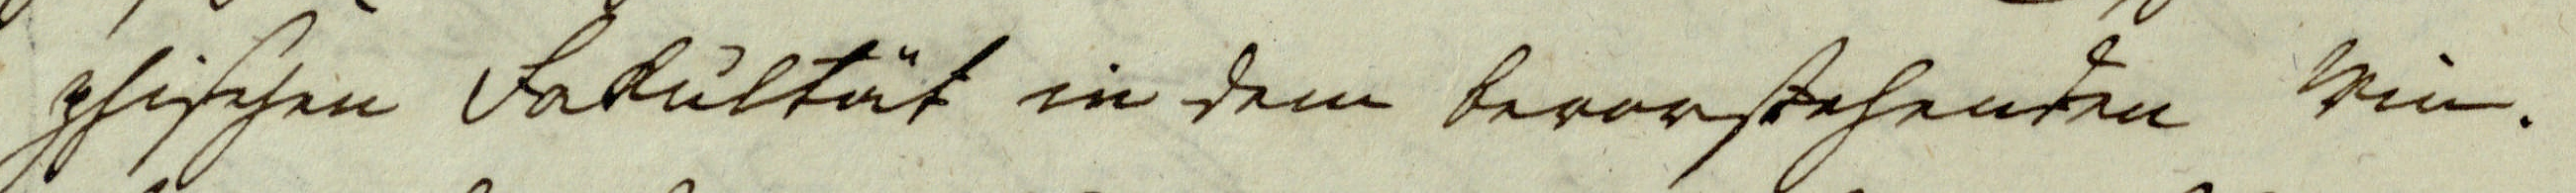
phischen Fakultät in dem bevorstehenden Win¬
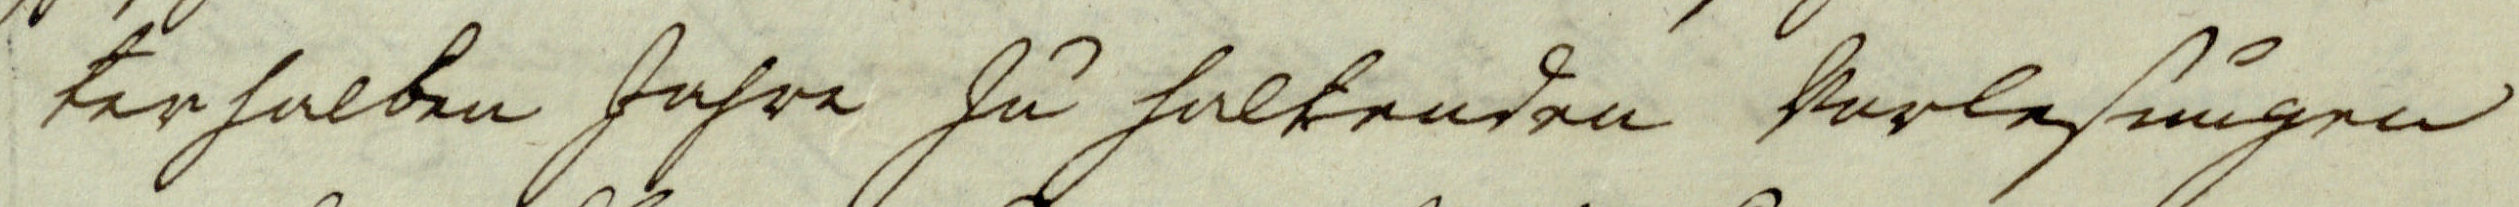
ter halben Jahre zu haltenden Vorlesungen
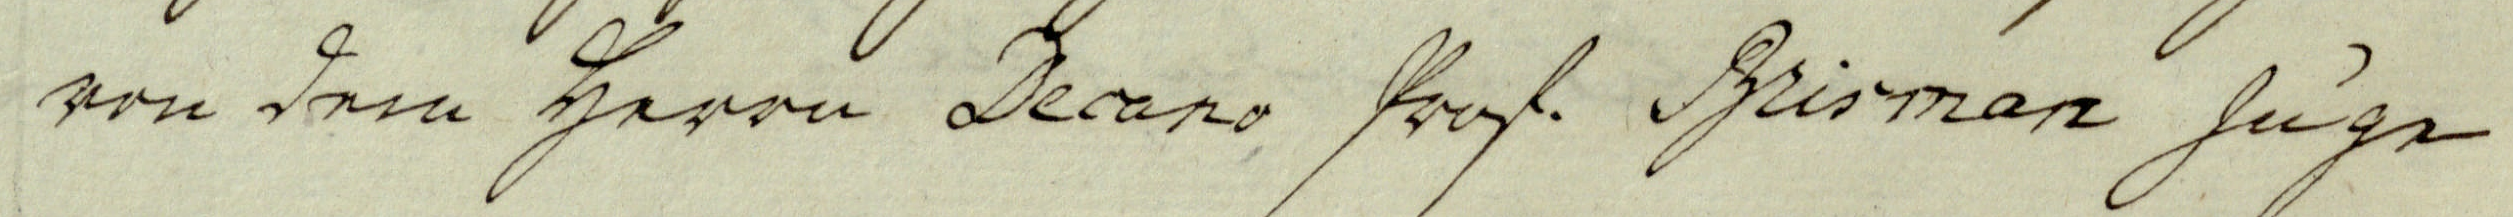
von dem Herrn Decano Prof. Brisman zuge¬
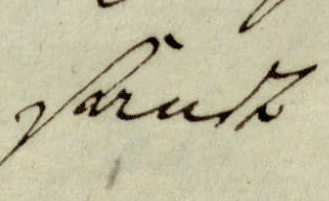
sandt
